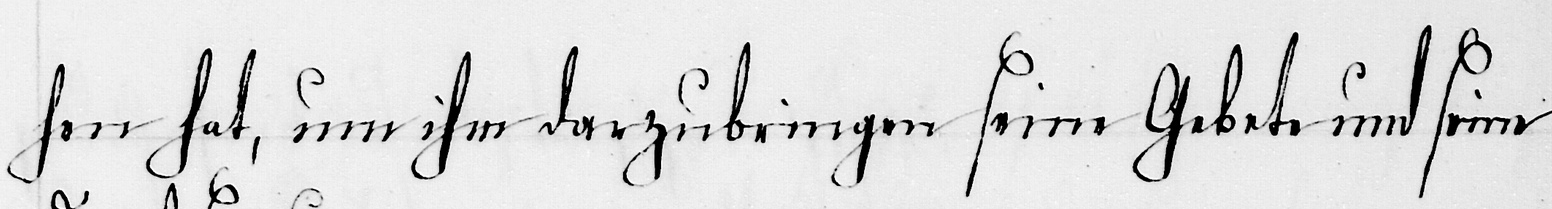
hen hat, um ihm darzubringen seine Gebete und seine
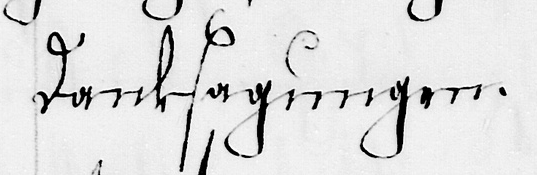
Danksagungen.
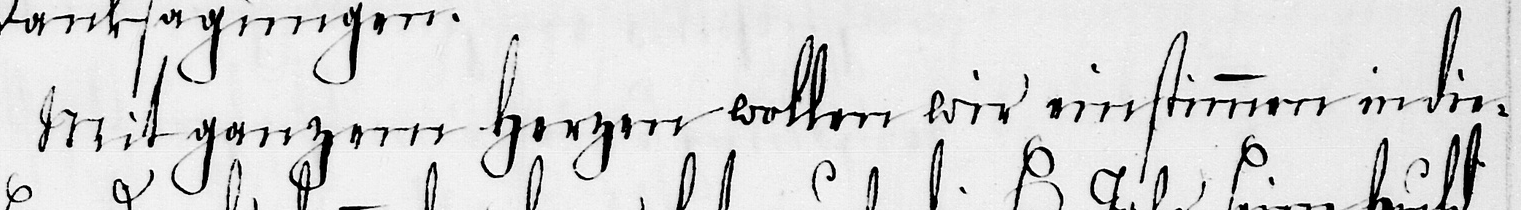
Mit ganzem Herzen wollen wir einstimmen in die¬
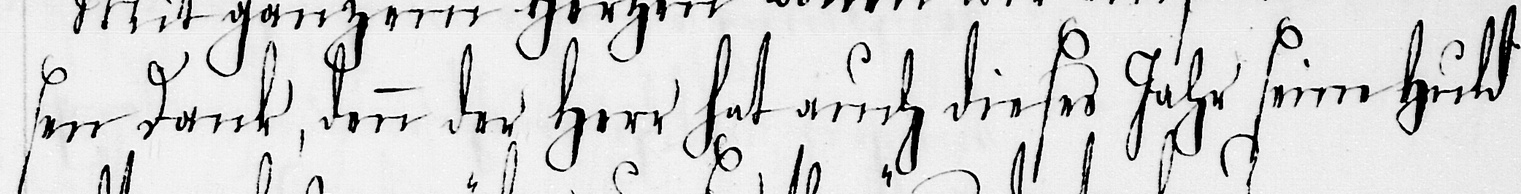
sen Dank, denn der Herr hat auch dieses Jahr seine Huld
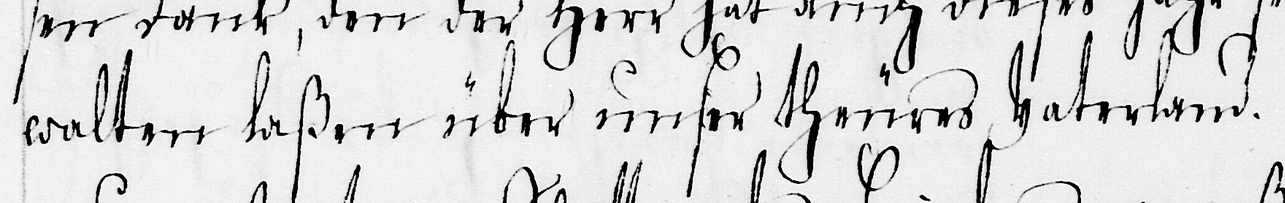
walten laßen über unser theures Vaterland.
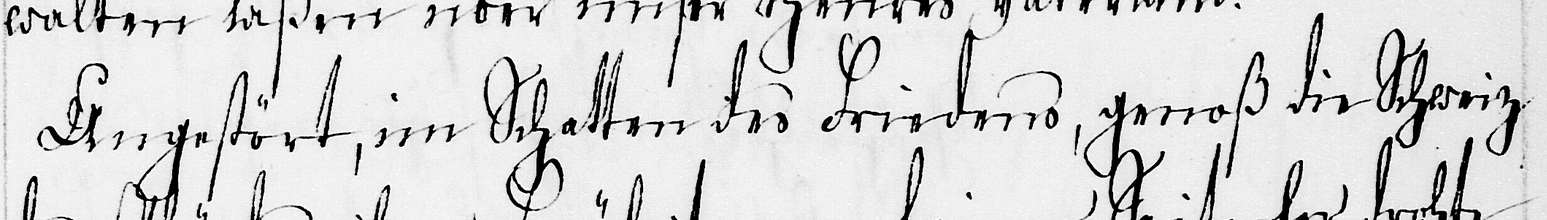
Ungestört, im Schatten des Friedens, genoß die Schweiz
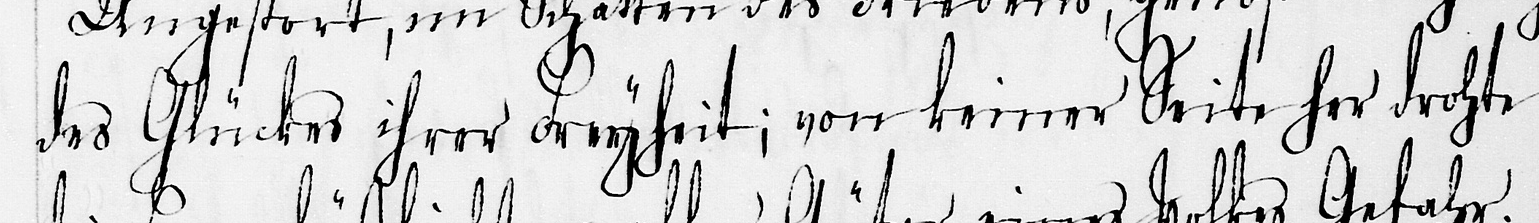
des Glückes ihrer Freyheit; von keiner Seite her drohte
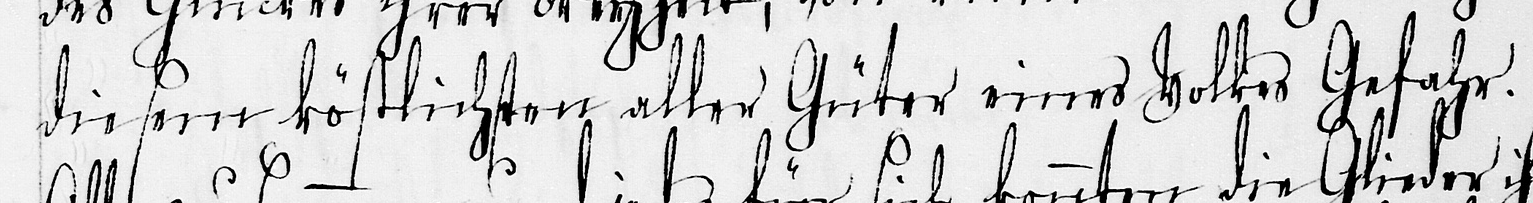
diesem köstlichsten aller Güter eines Volkes Gefahr.
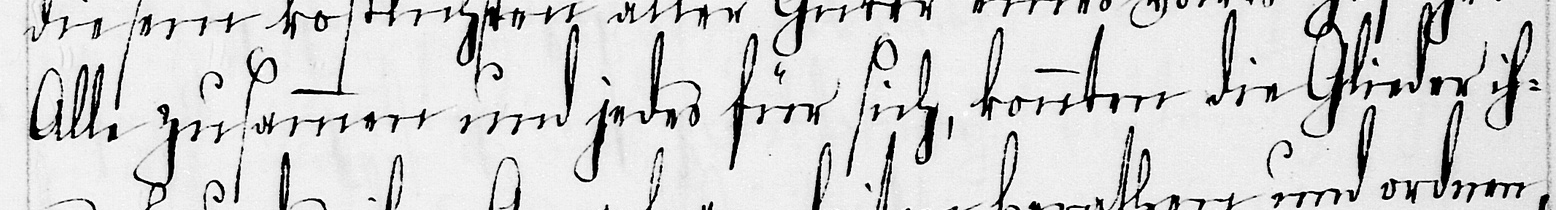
Alle zusammen und jedes für sich, konnten die Glieder ih¬
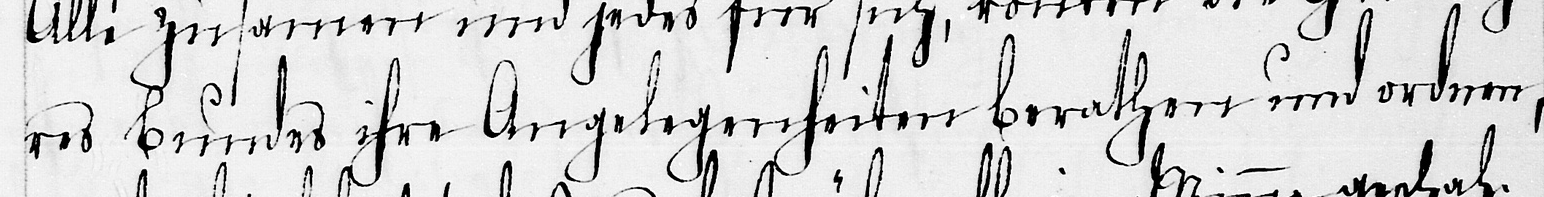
res Bundes ihre Angelegenheiten berathen und ordnen,
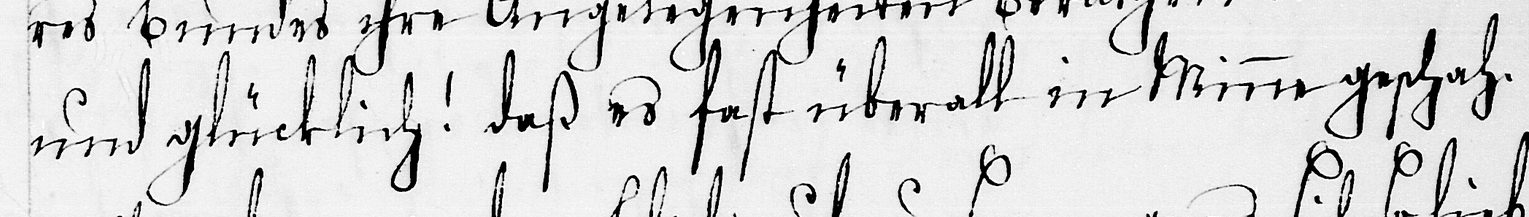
und glücklich! daß es fast überall in Minne geschah.
